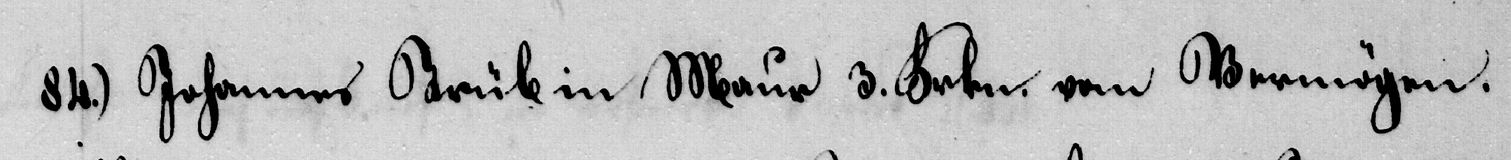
84.) Johannes Strüb in Maur 3. Frkn. vom Vermögen.
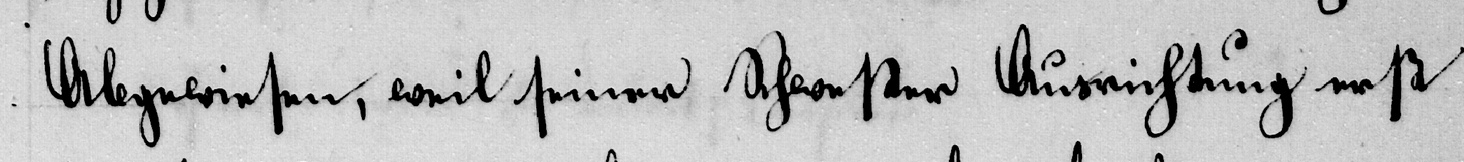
Abgewiesen, weil seiner Schwester Ausrichtung erst
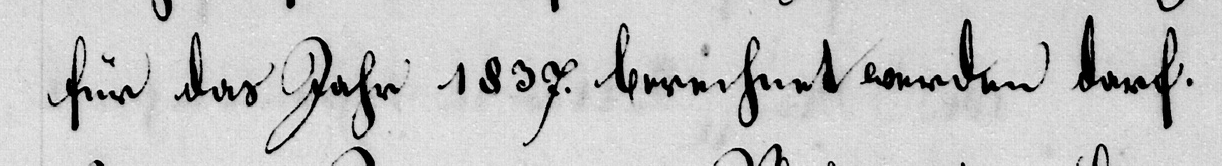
für das Jahr 1837. berechnet werden darf.
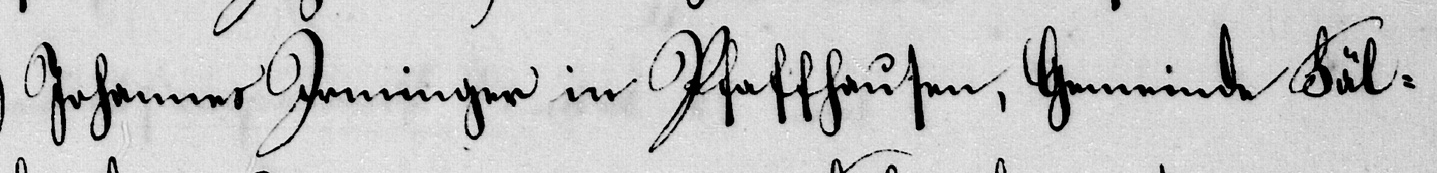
Johannes Irminger Pfaffhausen, Gemeinde Fäl¬
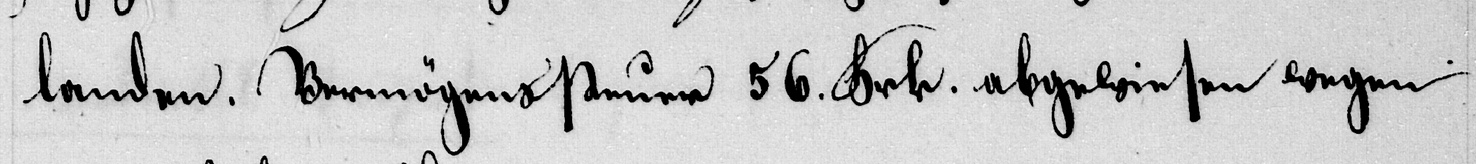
landen. Vermögenssteuer 56. Frk. abgewiesen wegen
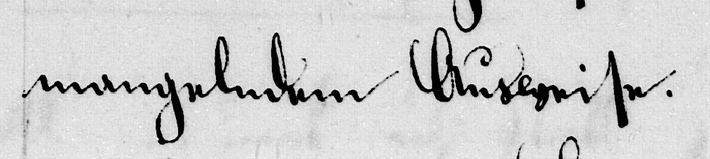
mangelndem Ausweise.
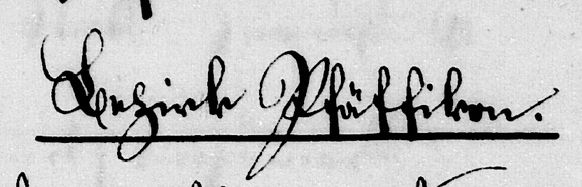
Bezirk Pfäffikon.
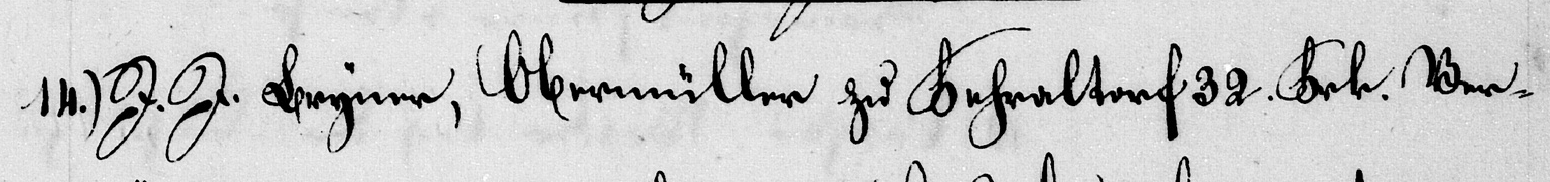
14.) J. J. Bryner, Obermüller zu Fehraltorf 32. Frk. Ver¬
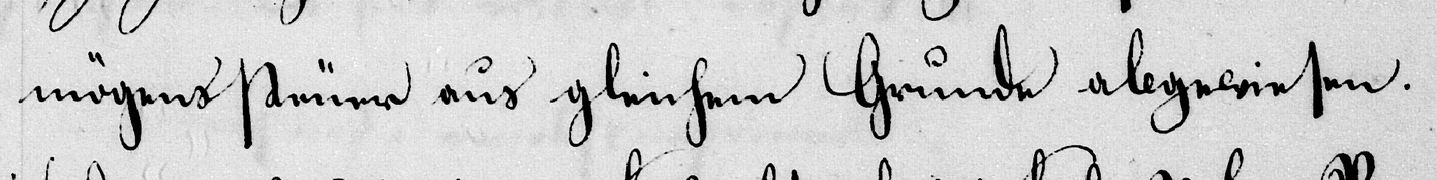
mögenssteuer aus gleichem Grunde abgewiesen.
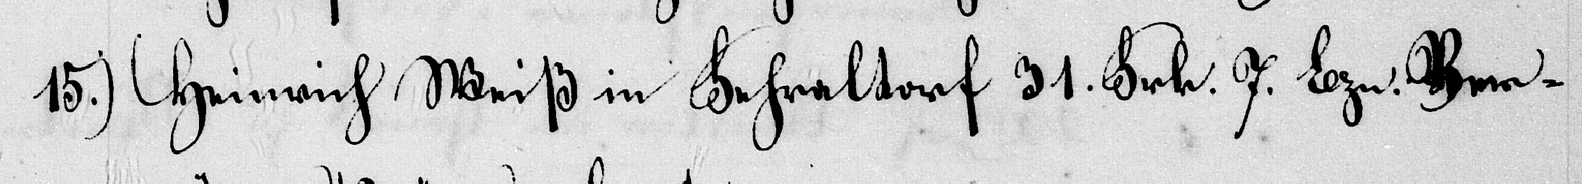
15.) Heinrich Weiß in Fehraltorf 31. Frk. 7. Bzn. Ver¬
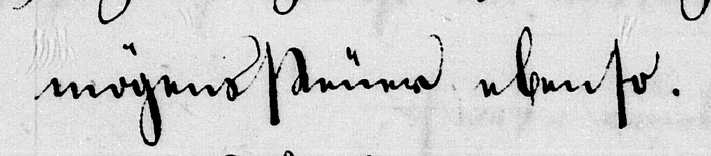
mögenssteuer ebenso.
